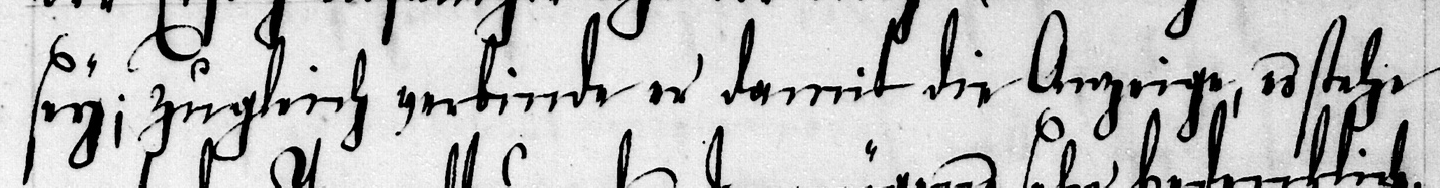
sey; zugleich verbinde er damit die Anzeige, es stehe
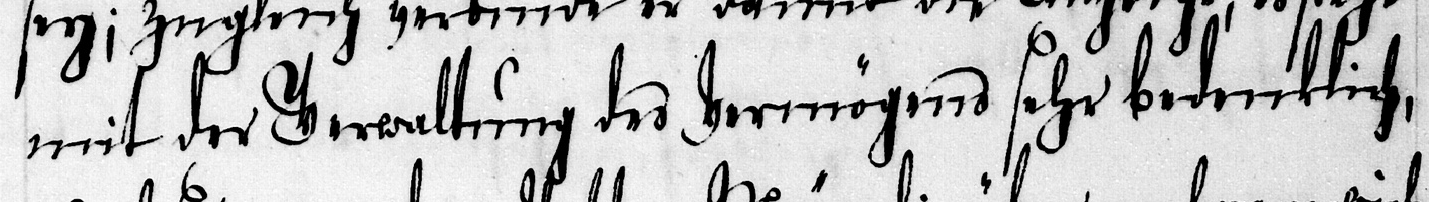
mit der Verwaltung des Vermögens sehr bedenklich,
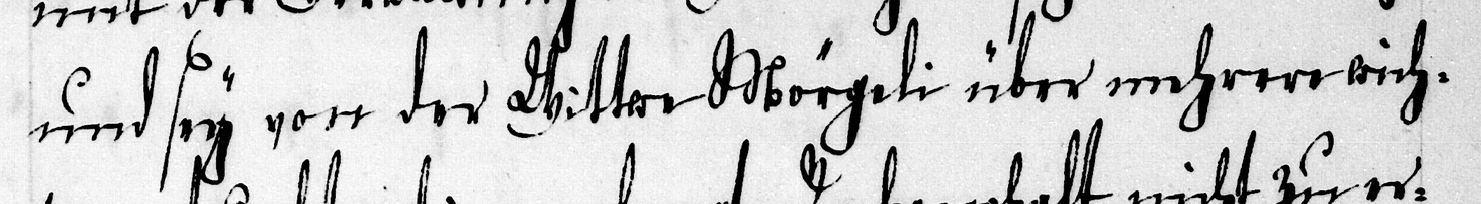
und sey von der Wittwe Mörgeli über mehrere wich¬
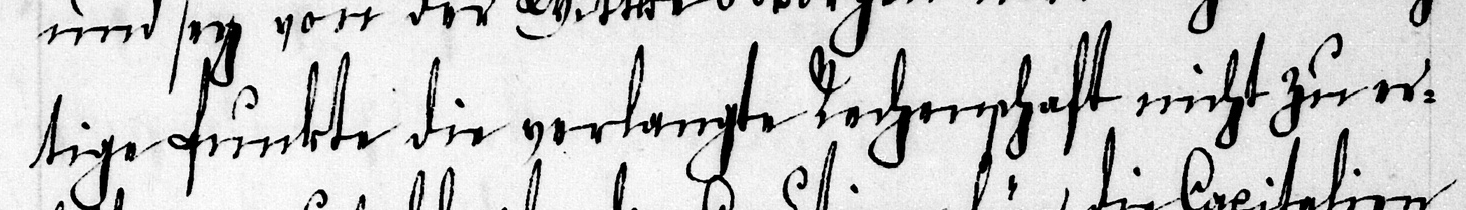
tige Punkte die verlangte Rechenschaft nicht zu er¬
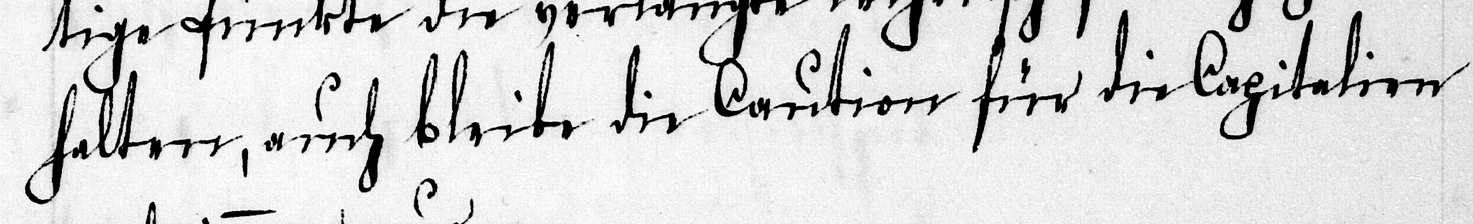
halten, auch bleibe die Caution für die Capitalien
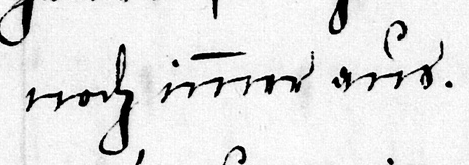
noch immer aus.
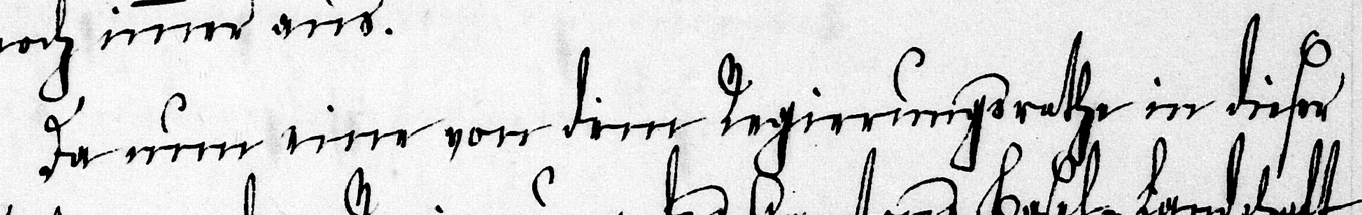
Da nun eine von dem Regierungsrathe in dieser
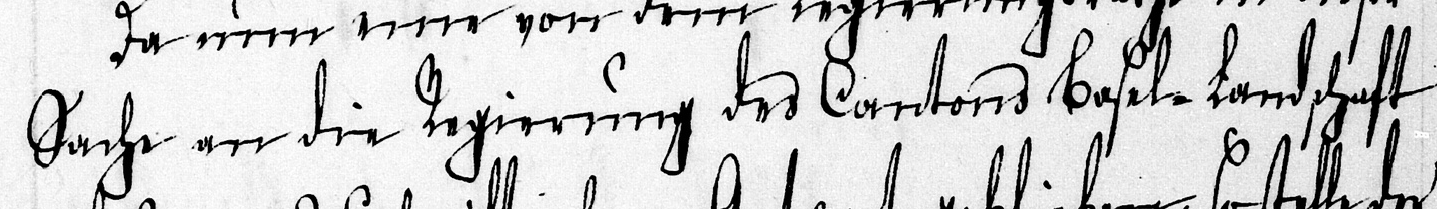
Sache an die Regierung des Cantons Basel-Landschaft
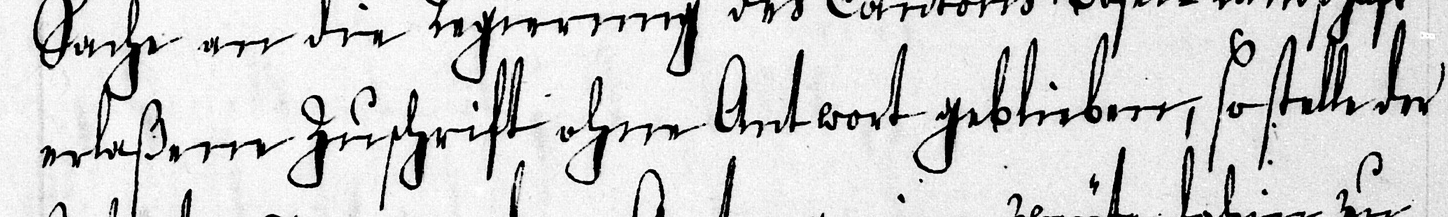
erlaßene Zuschrift ohne Antwort geblieben, so stelle
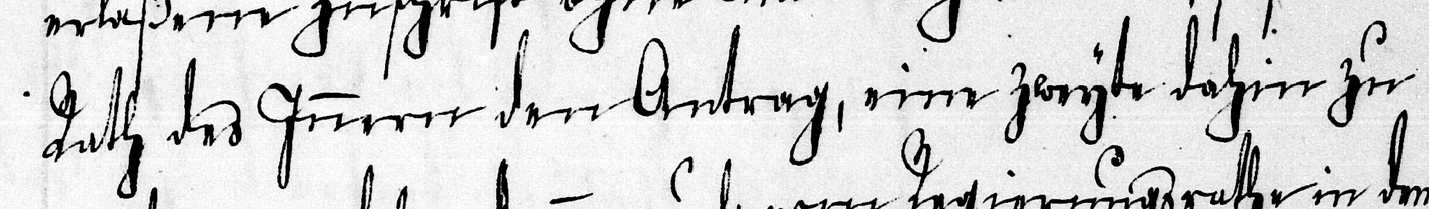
Rath des Innern den Antrag, eine zweyte dahin zu
